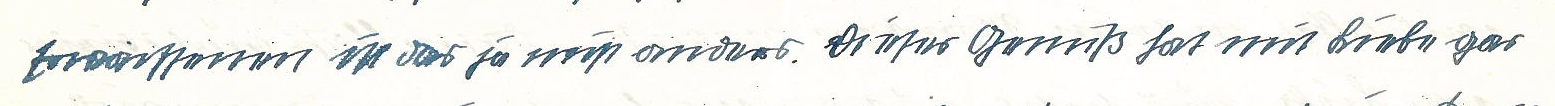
Erwachsenen ist das ja auch nicht anders. Dieser Genuß hat mit Liebe gar
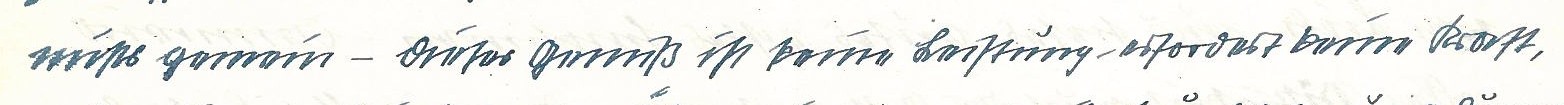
nichts gemein – dieser Genuß ist keine Leistung – erfordest keine kraft,
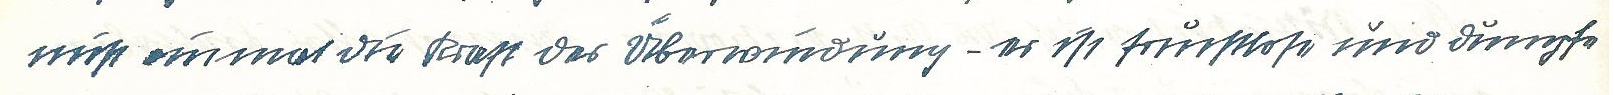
nicht einmal die kraft des Überwindung – er ist fruchtlose und dumpfe
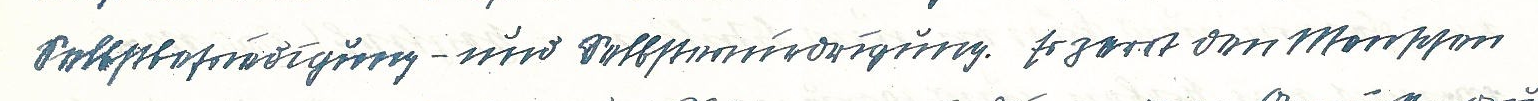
Selbstbefriedigung – und Selbsterniedrigung. Er zerrt den Menschen
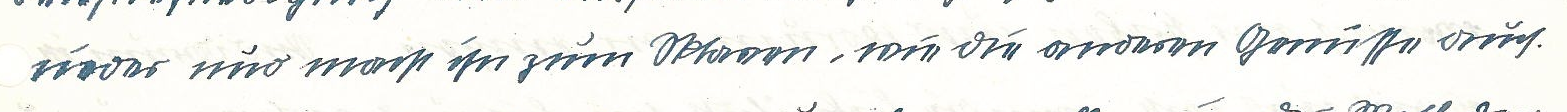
nieder und macht ihn zum Sklaven, wie die anderen Genüsse auch.
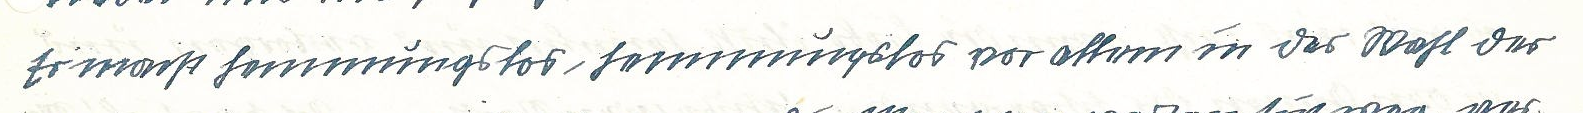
Er macht hemmungslos, hemmungslos vor allem in der Wahl der
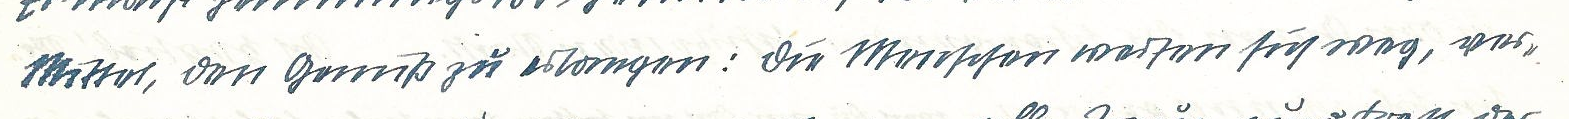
Mittel, den Genuß zu erlangen: Die Menschen werfen sich weg, ver¬
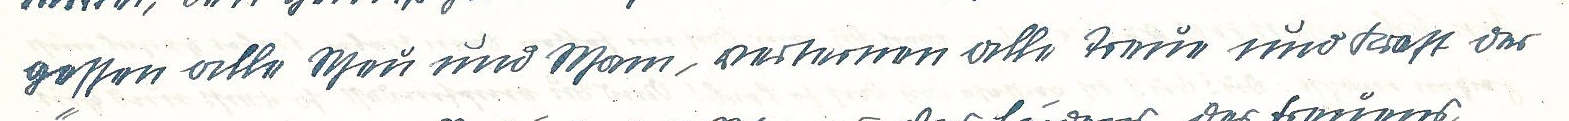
gessen alle Scheu und Scham, verlernen alle Treue und Kraft der
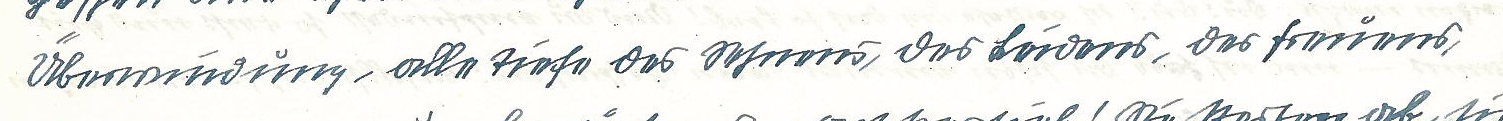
Überwindung, alle Tiefe des Sehnens, des Leidens, des Freuens,
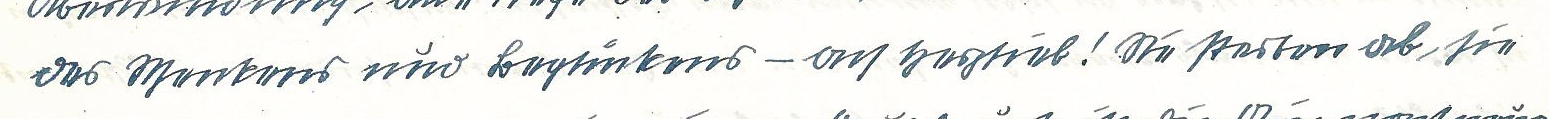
des Schenkens und Beglückens – ach Herzlieb! Sie sterben ab, sie
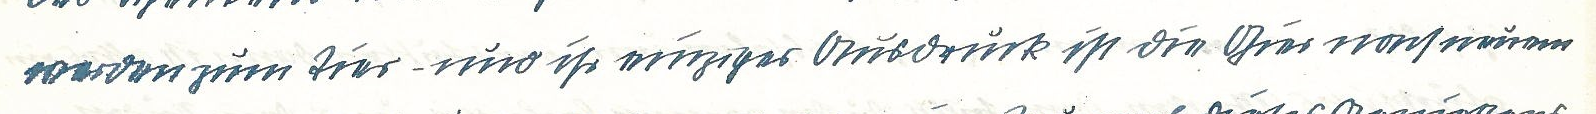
werden zum Tier – und ihr einziger Ausdruck ist Gier nach neuem
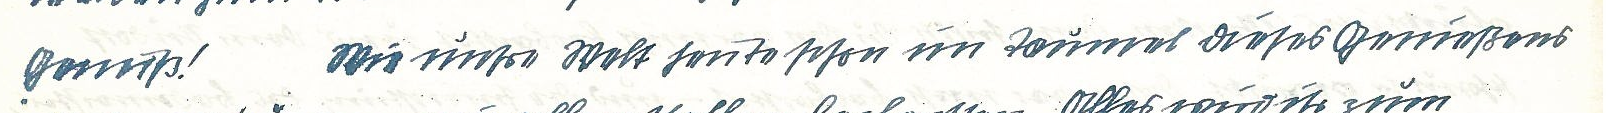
Genuß! Wie unsre Welt heute schon im Taumel dieses Genießens
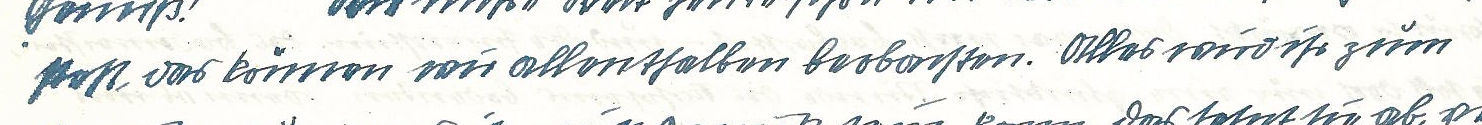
steht, das können wir allenthalben beobachten. Alles wird ihr zum
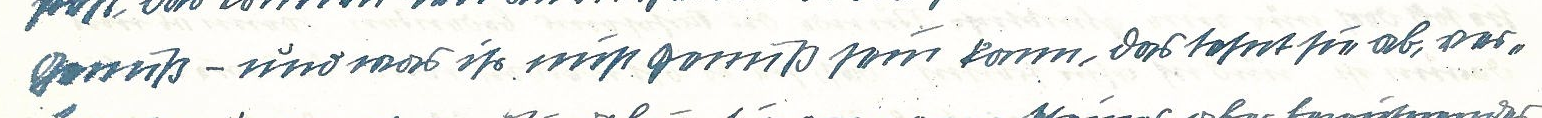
Genuß – und was ihr nicht Genuß sein kann, das lehnt sie ab, ver¬
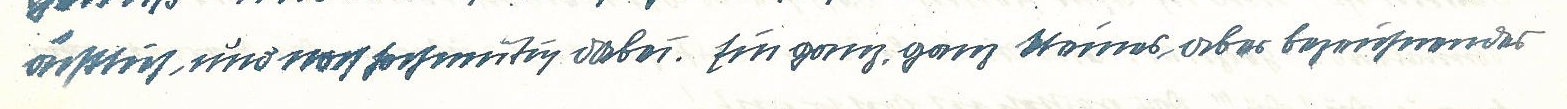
ächtlich, und noch hochmütig dabei. Ein ganz, ganz kleines, aber bezeichnendes
